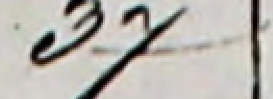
37
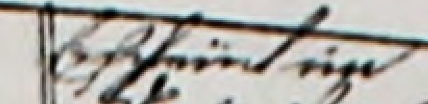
Esseint im
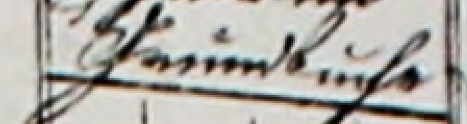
Grundbuche
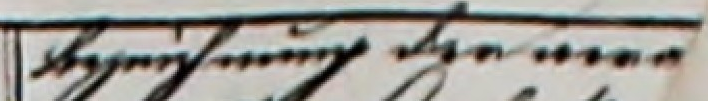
Bezeichnung der erarischen
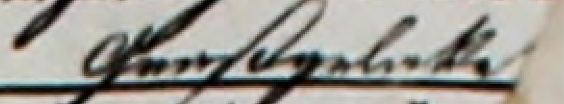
Graßgelake
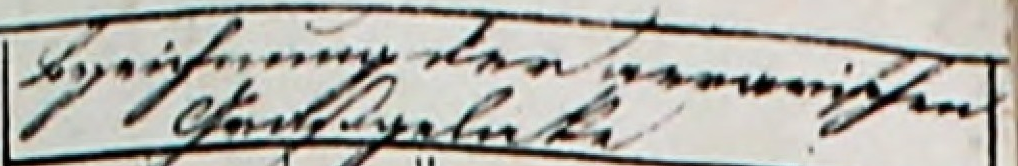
Bezeichnung der erarischen
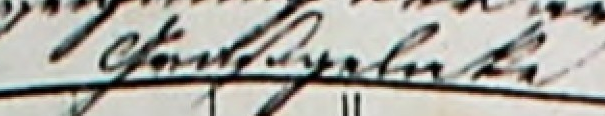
Graßgelake
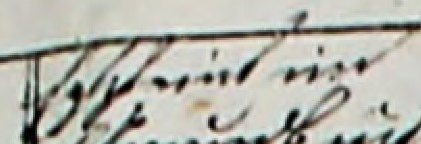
Esseint im
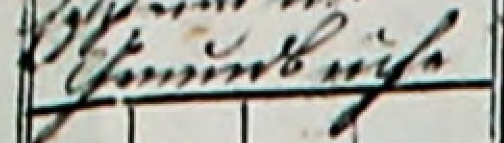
Grundbuche
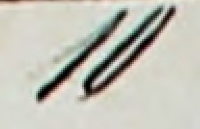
10
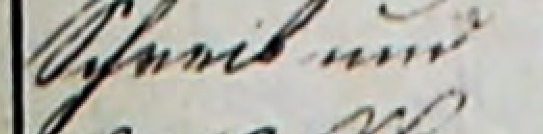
37
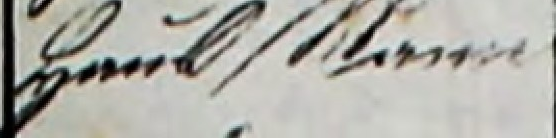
Schreib und
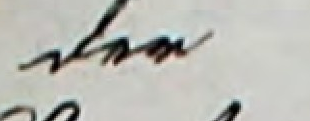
Haus Name
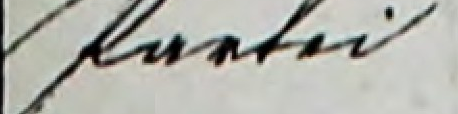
der Partei.
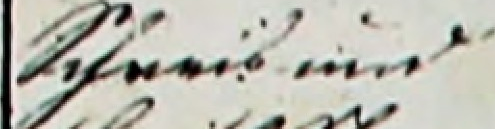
Schreib und
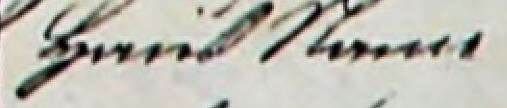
Haus Name
